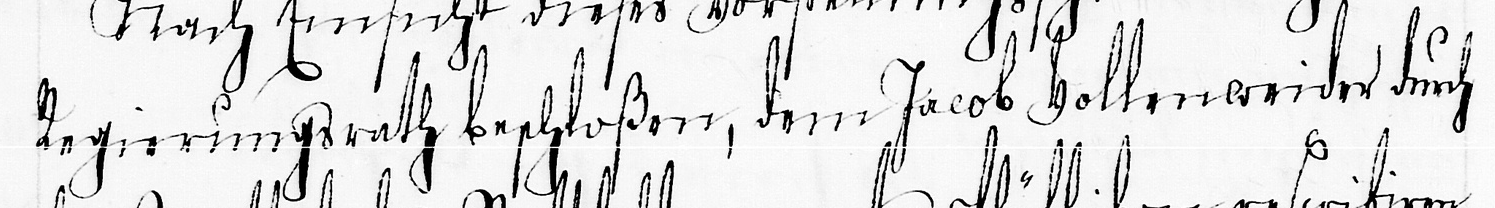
Regierungsrath beschloßen, dem Jacob Vollenweider durch
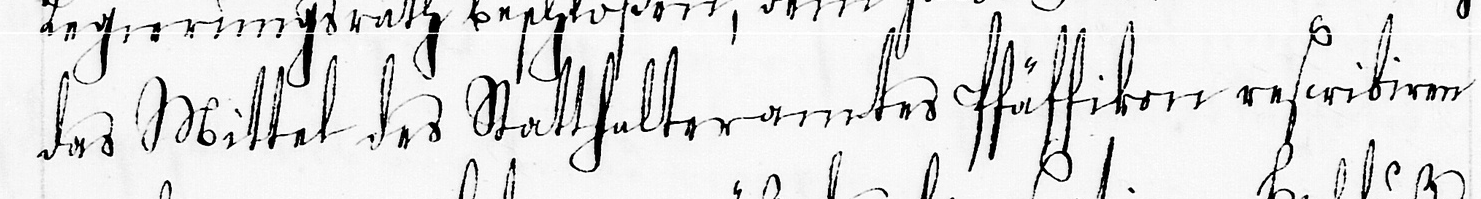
das Mittel des Statthalteramtes Pfäffikon rescribiren
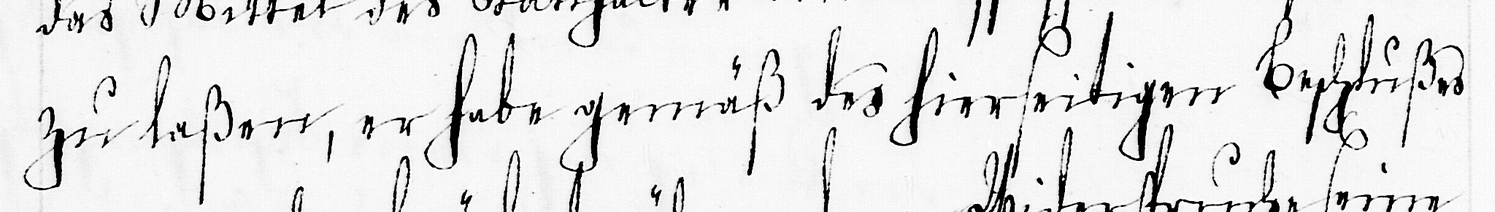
zu laßen, er habe gemäß des hierseitigen Beschlußes
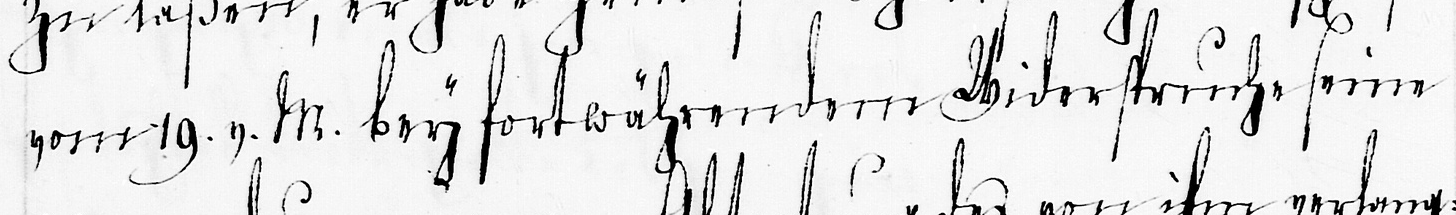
vom 19. v. M. bey fortwährendem Widerspruche seine
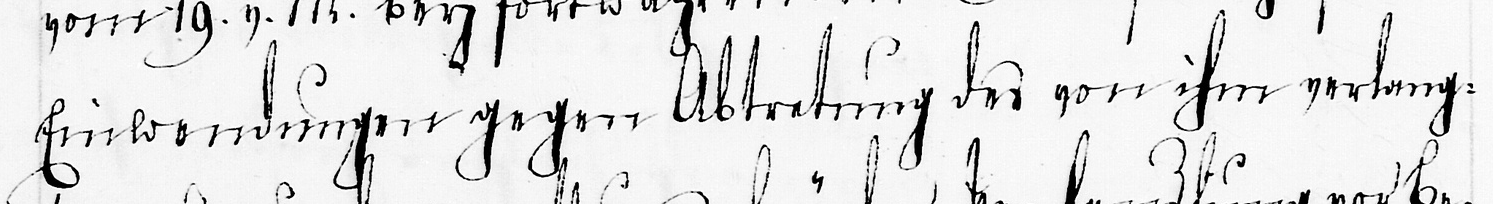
Einwendungen gegen Abtretung des von ihm verlang¬
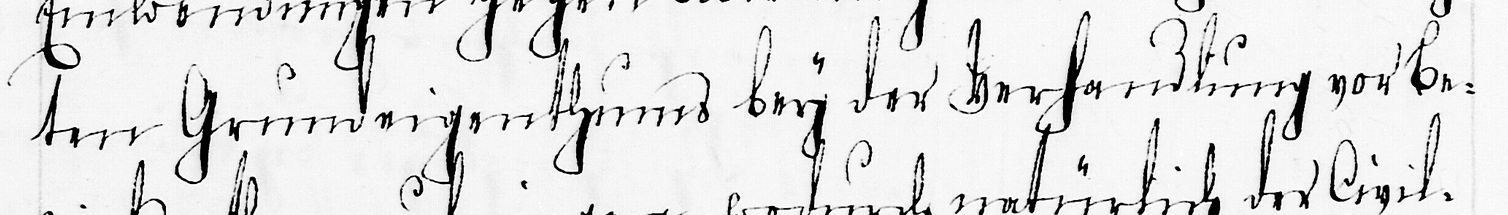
ten Grundeigenthums bey der Verhandlung vor Be¬
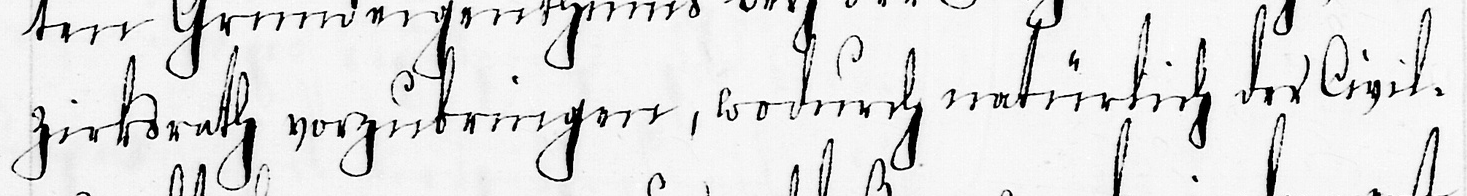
zirksrath vorzubringen, wodurch natürlich der Civil¬
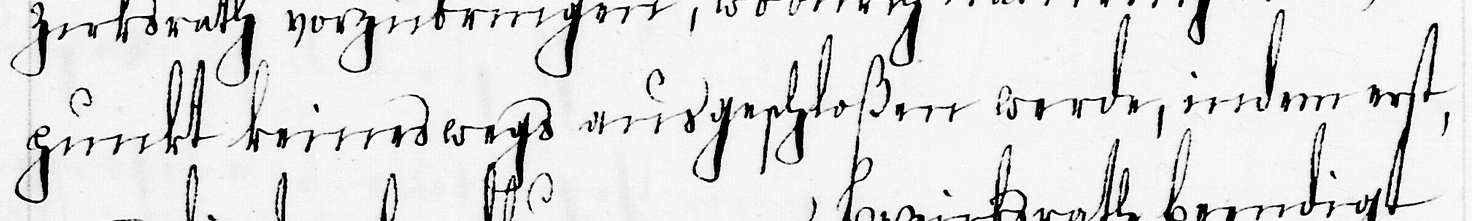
punkt keineswegs ausgeschloßen werde, indem erst,
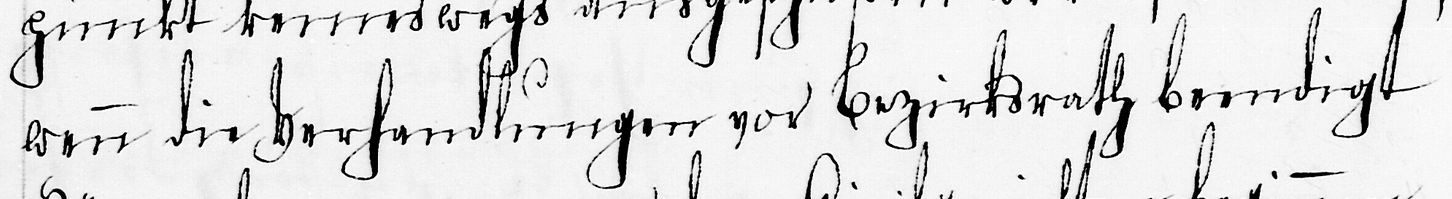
wenn die Verhandlungen vor Bezirksrath beendigt
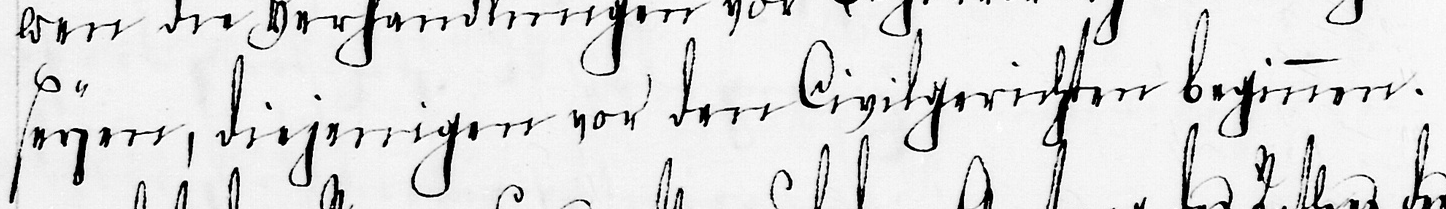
seyen, diejenigen vor den Civilgerichten beginnen.
